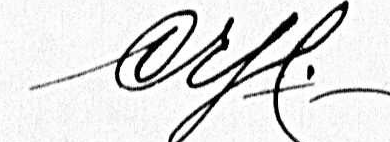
AhE
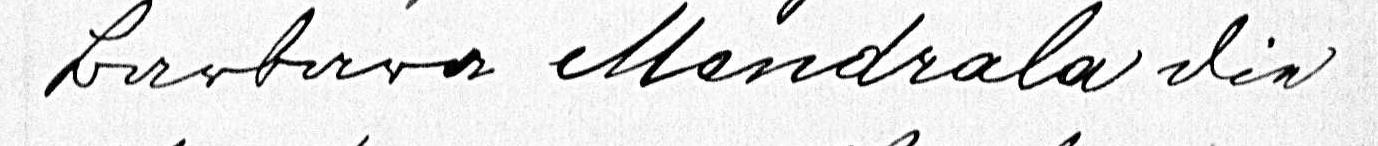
Barbara Mendrala die
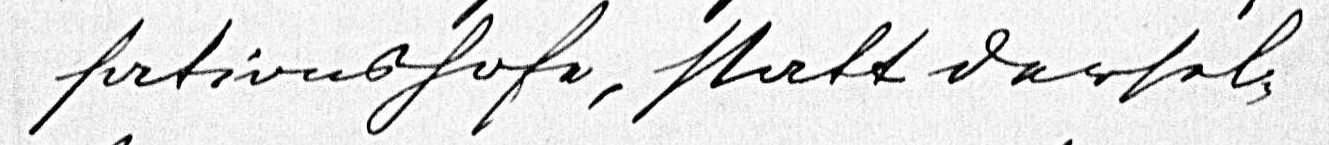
sationshofe, statt dersel¬
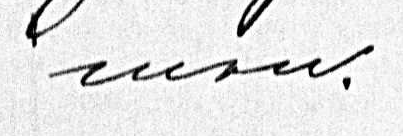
men.
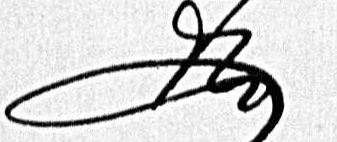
FJ
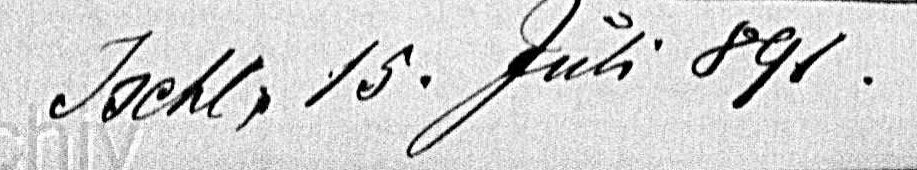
Ischl, 15. Juli 1891
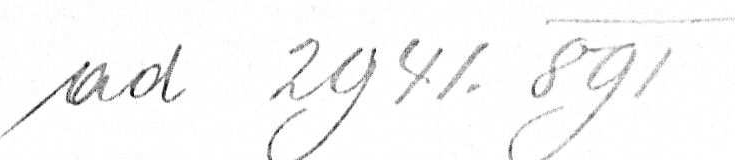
ad 2941 1891
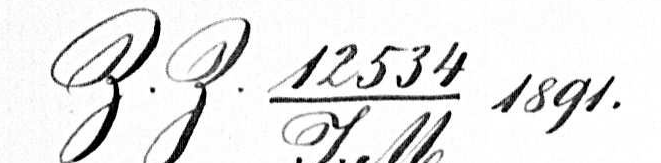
ZZ. 12534/ – 1891
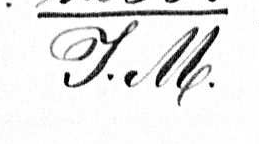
JM
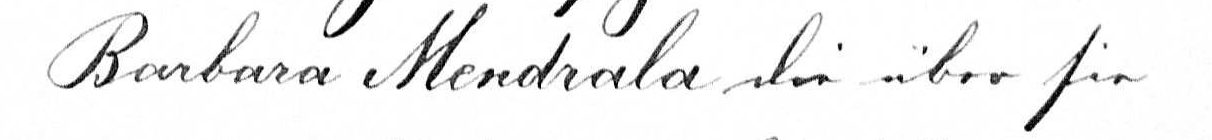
Barbara Mendrala die über sie
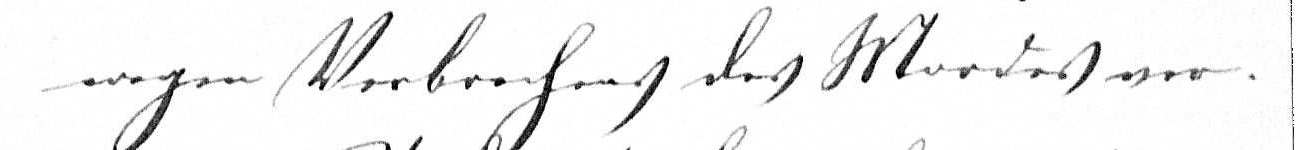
wegen Verbrechens des Mordes ver¬
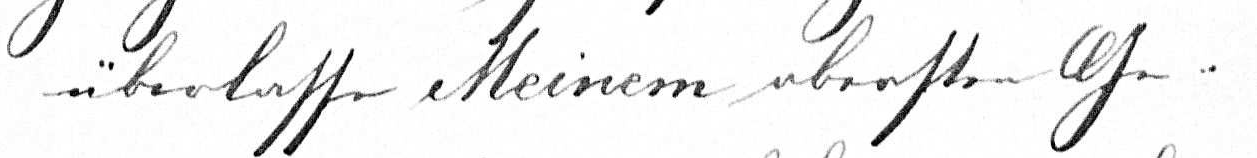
überlasse Meinem Obersten Ge¬
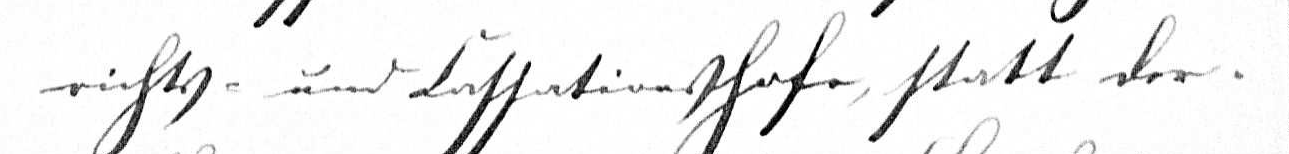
richts- und Cassationshofe, statt der¬
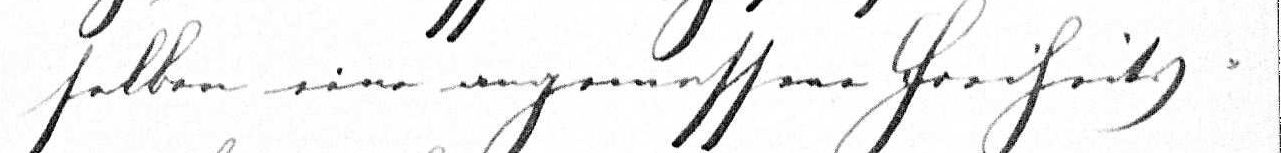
selben eine angemessene Freiheits¬
